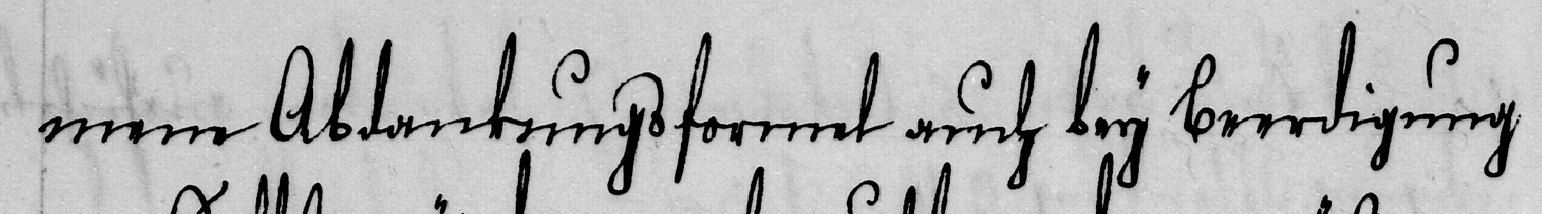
mene Abdankungsformel auch bey Beerdigung
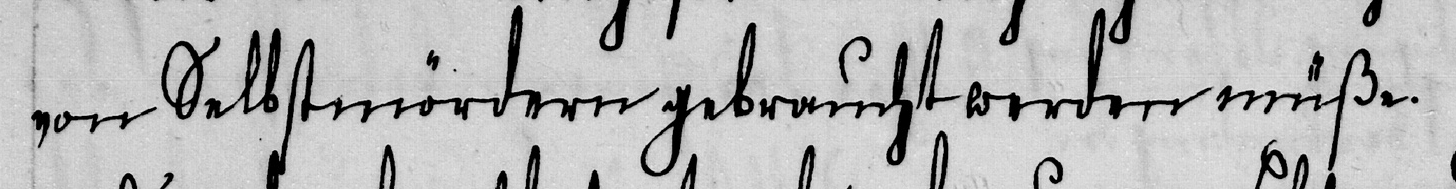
von Selbstmördern gebraucht werden müße.
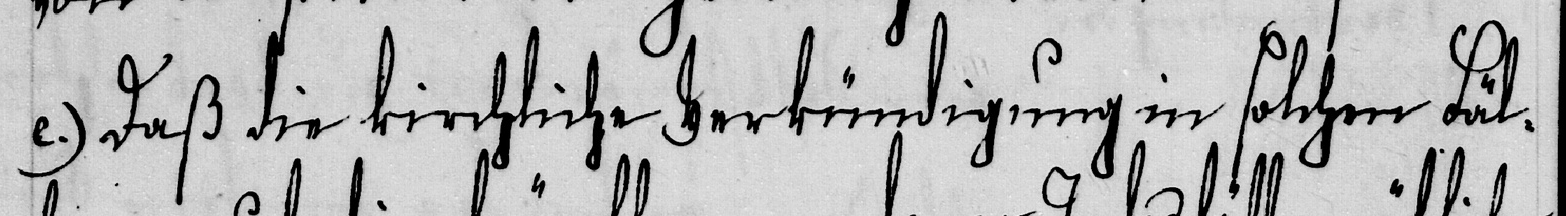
e.) Daß die kirchliche Verkündigung in solchen Fäl¬
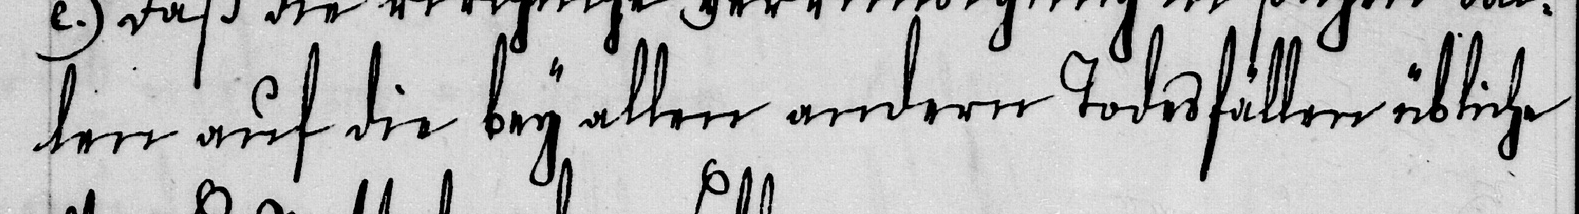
len auf die bey allen andern Todesfällen übliche
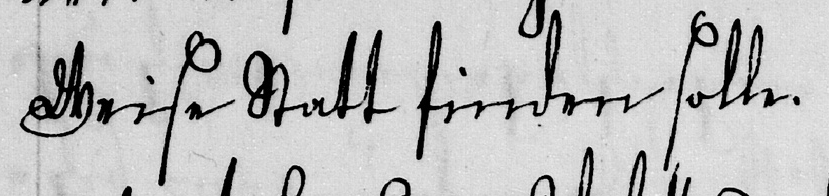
Weise Statt finden solle.
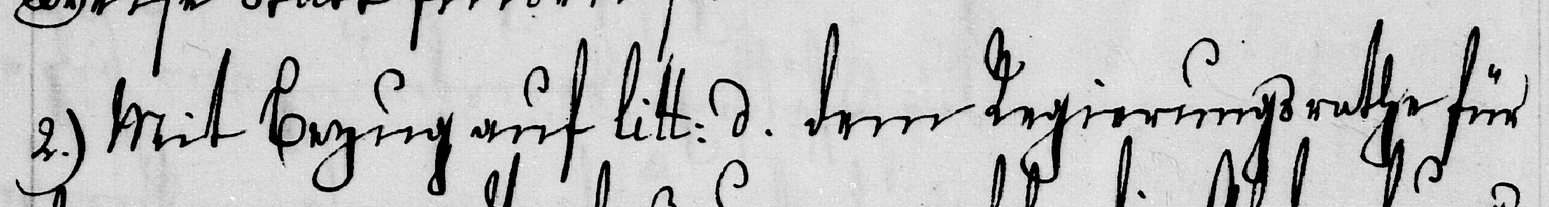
2.) Mit Bezug auf litt: d. dem Regierungsrathe für
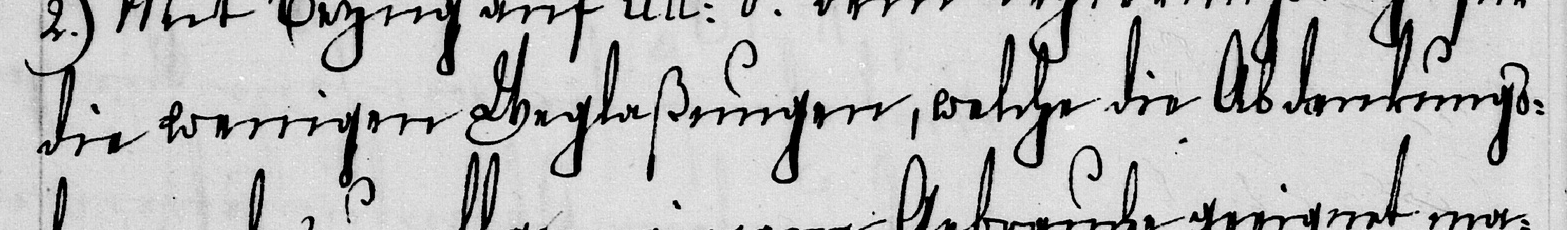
die wenigen Weglaßungen, welche die Abdankungs¬
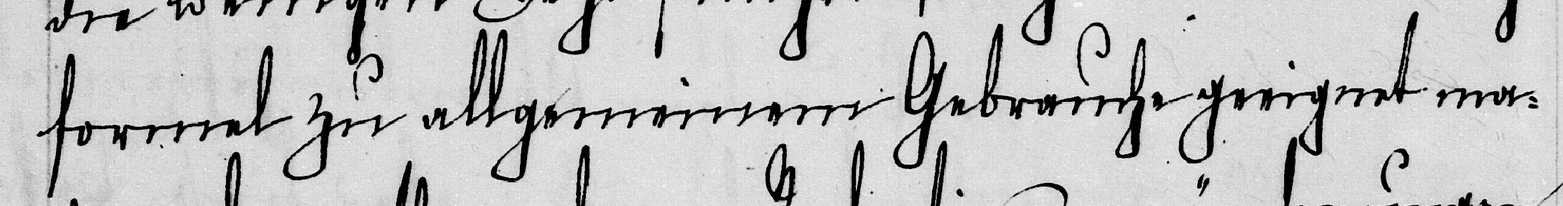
formel zu allgemeinem Gebrauche geeignet ma¬
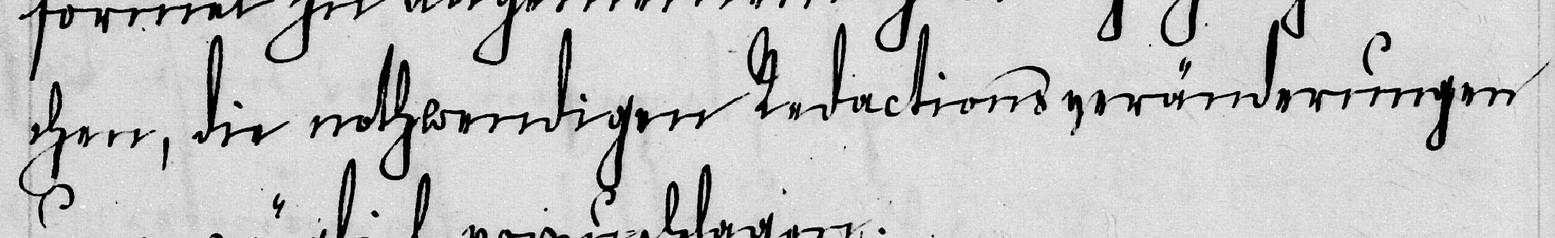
chen, die nothwendigen Redactionsveränderungen
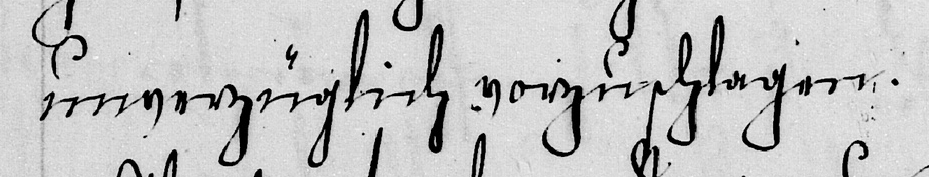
unverzüglich vorzuschlagen.
